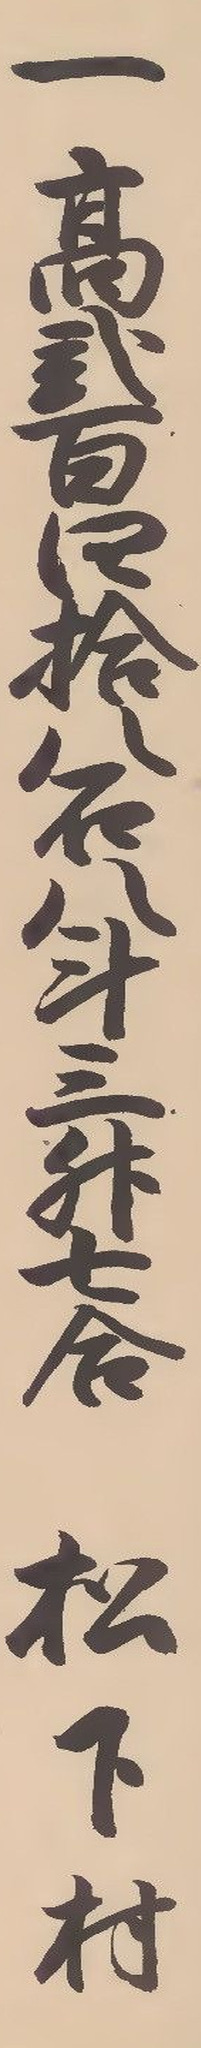一高弐百四拾八石八斗三升七合松下村
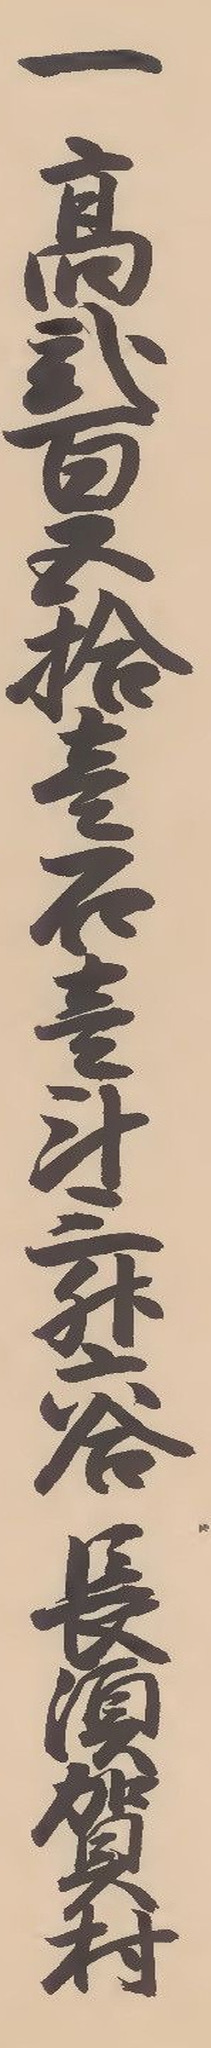一高弐百五拾壱石壱斗三升六合長須賀村
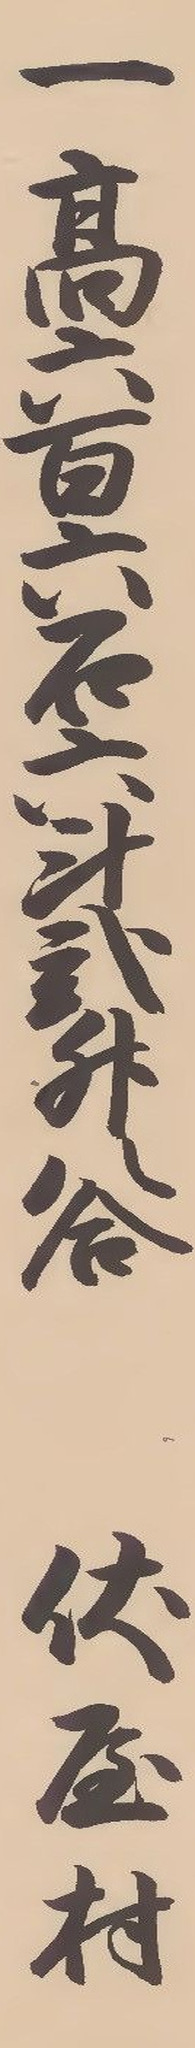一高六百六石六斗弐升八合伏屋村

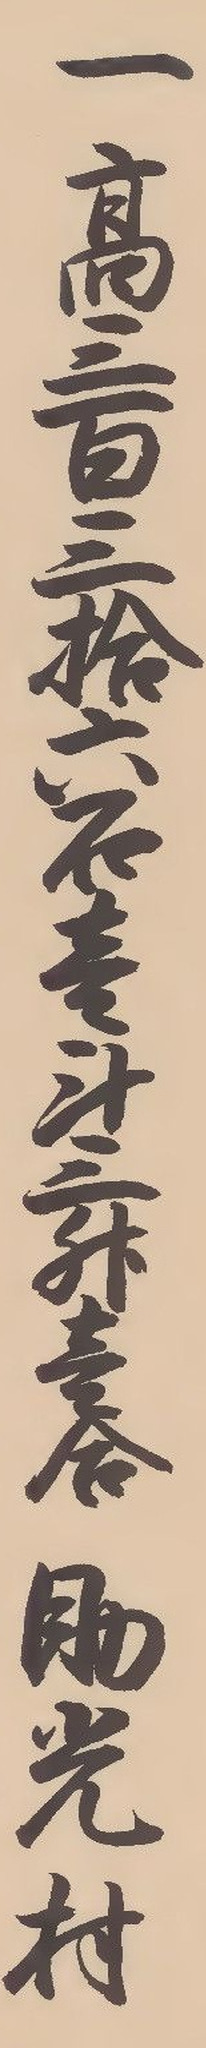一高三百三拾六石壱斗三升壱合助光村
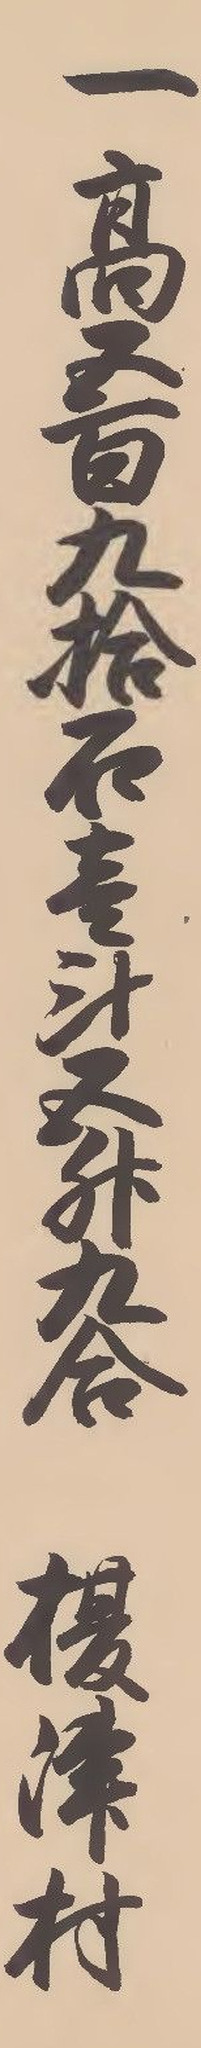一高五百九拾石壱斗五升九合榎津村
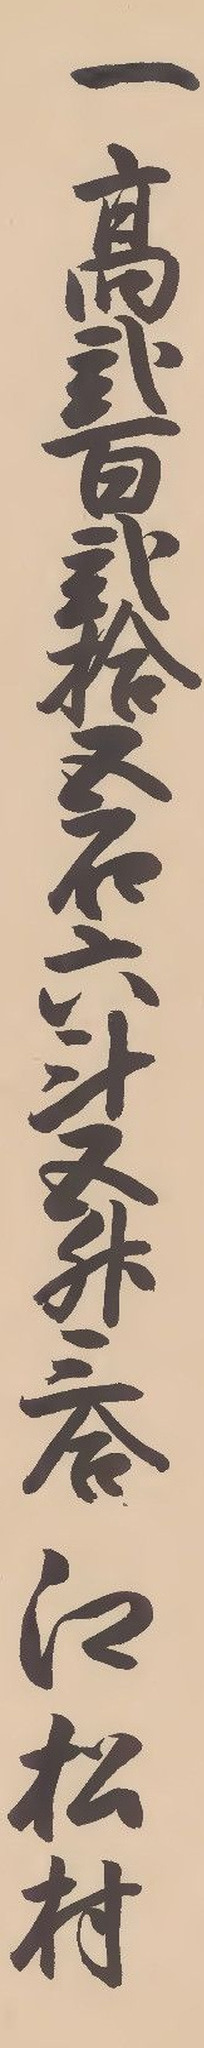一高弐百弐拾五石六斗五升三合江松村
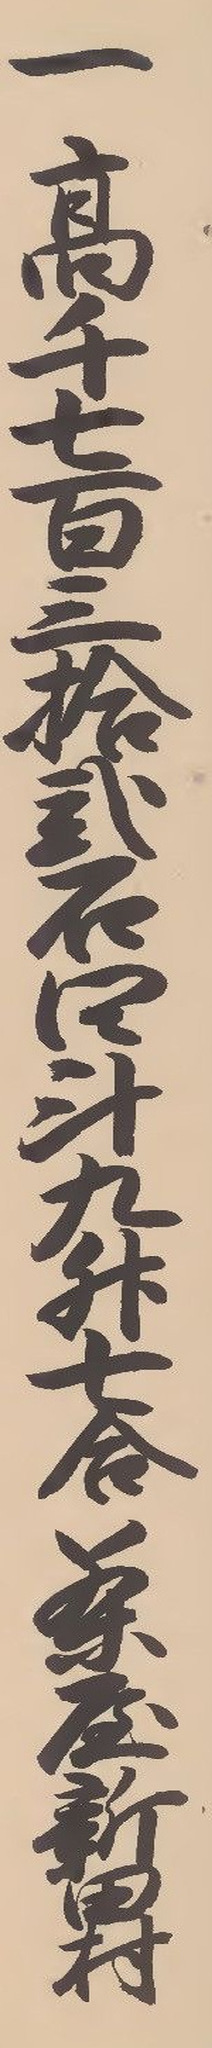一高千七百三拾弐石四斗九升七合茶屋新田村
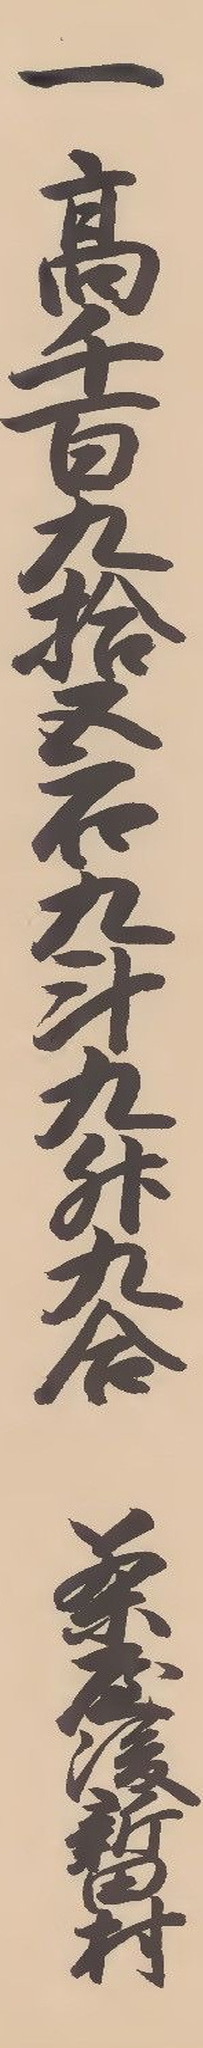一高千百九拾五石九斗九升九合茶屋後新田村
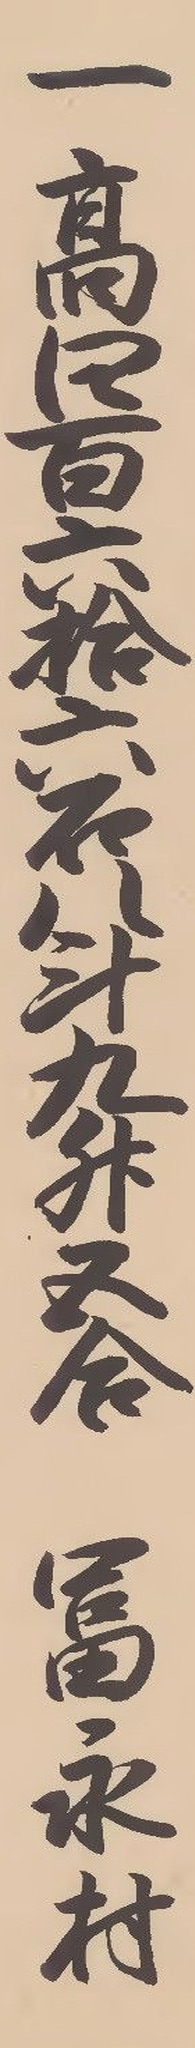一高四百六拾六石八斗九升五合富永村
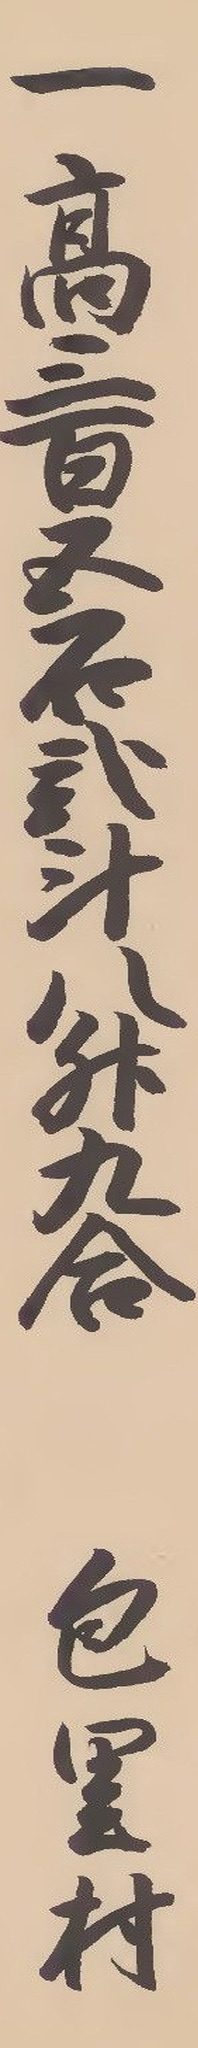一高三百五石弐斗八升九合包里村

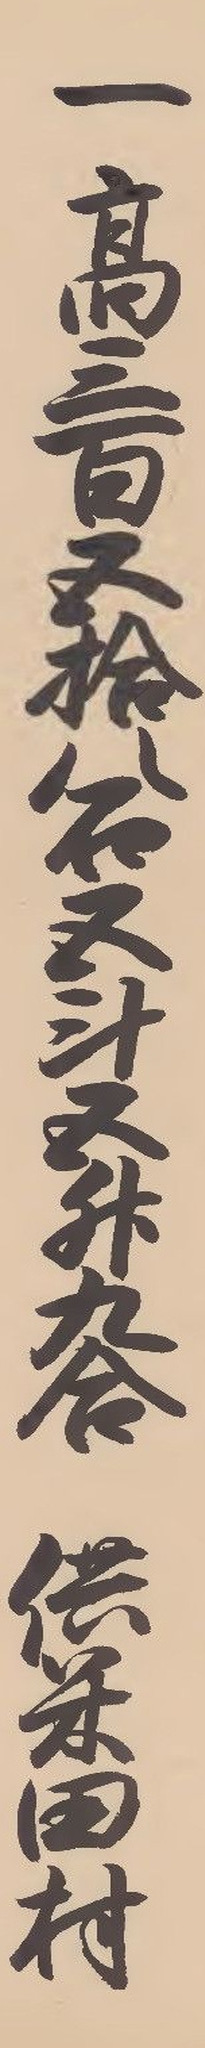一高三百五拾八石五斗五升九合供米田村
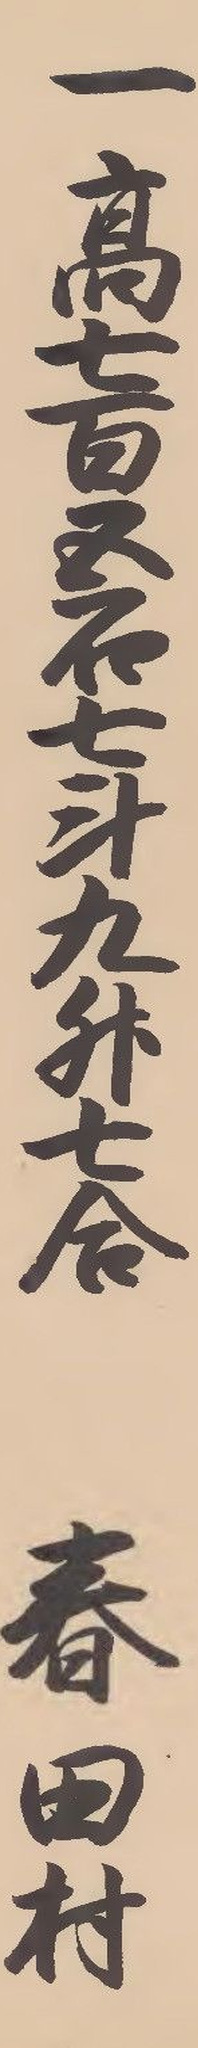一高七百五石七斗九升七合春田村
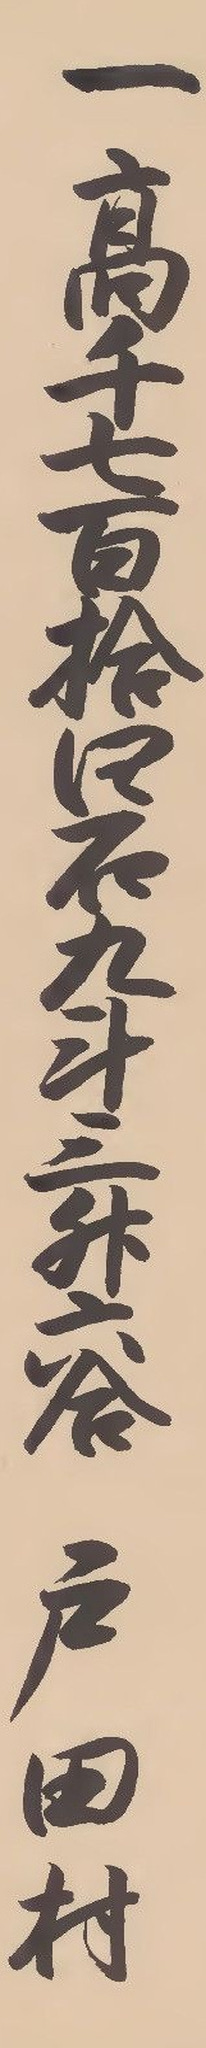一高千七百拾四石九斗三升六合戸田村
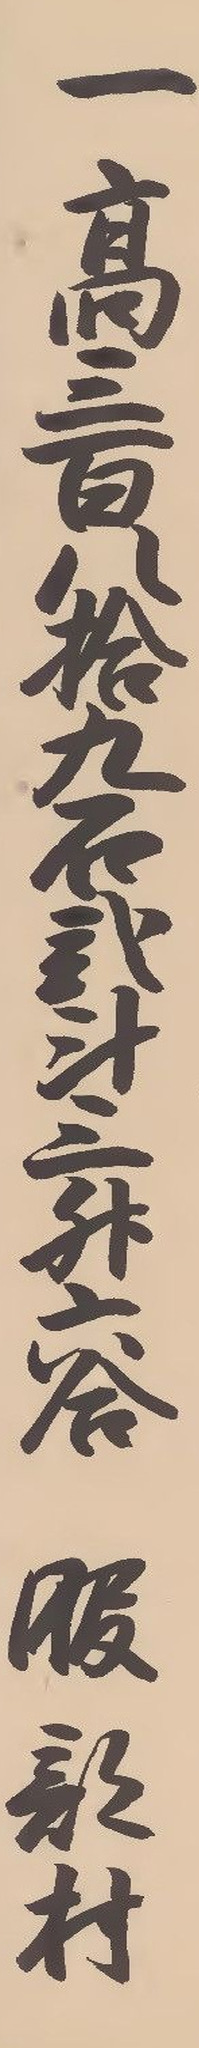一高三百八拾九石弐斗三升六合服部村
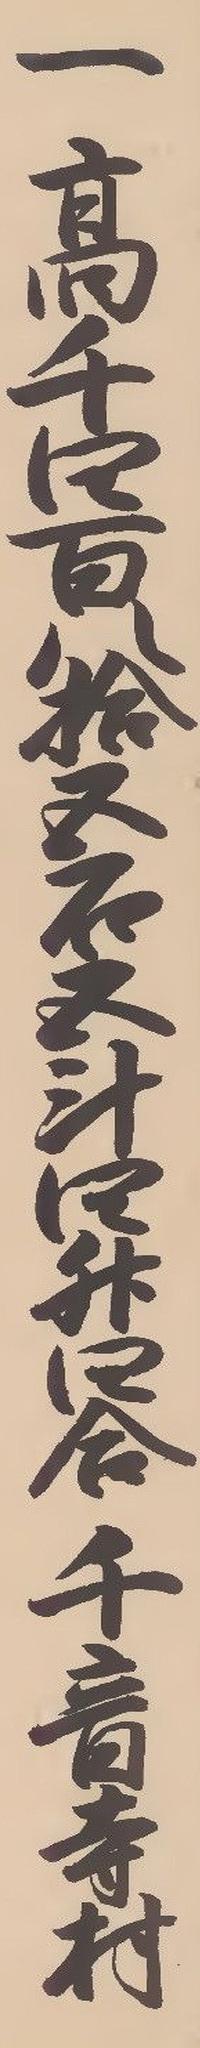一高千四百八拾五石五斗四升四合千音寺村
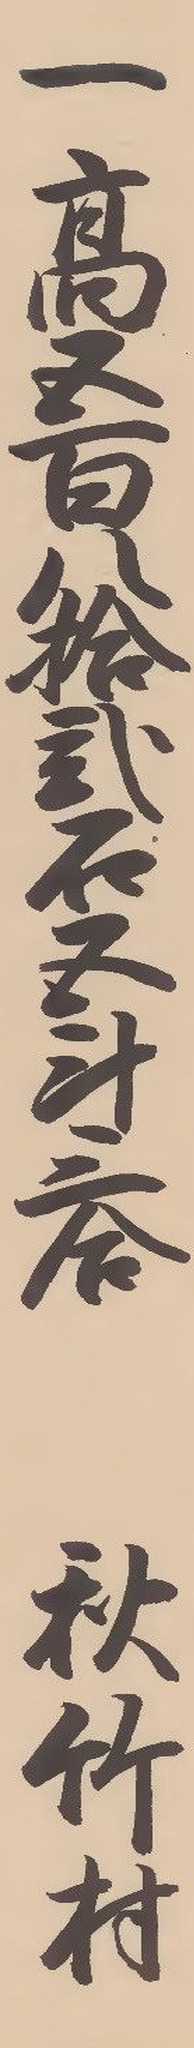一高五百八拾弐石五斗三合秋竹村
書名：尾張国郷帳
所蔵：国立公文書館 National Archives of Japan
